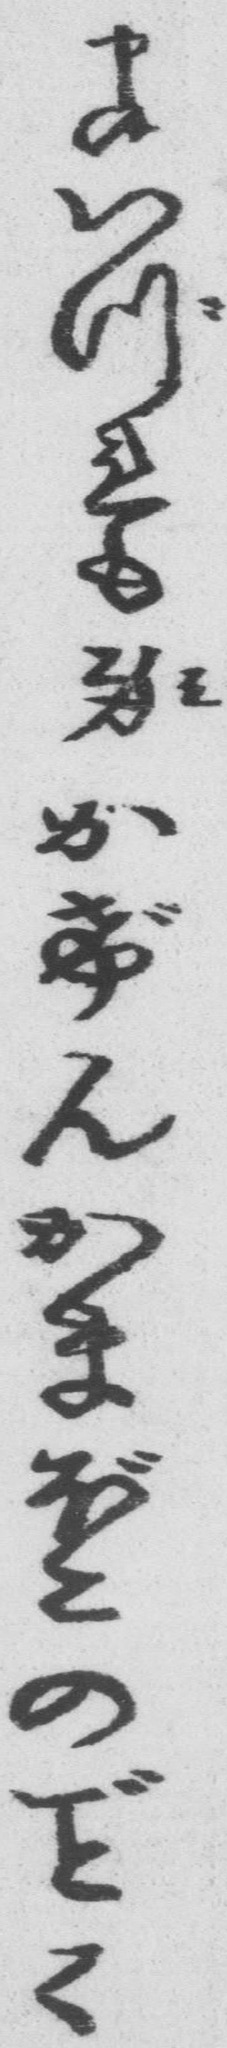いつれも身かげんかまぼこのごとく
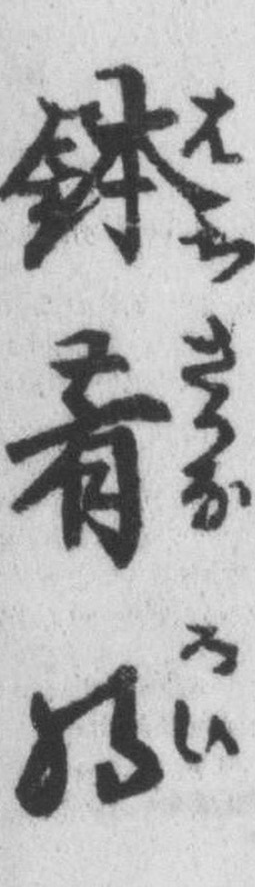鉢肴類
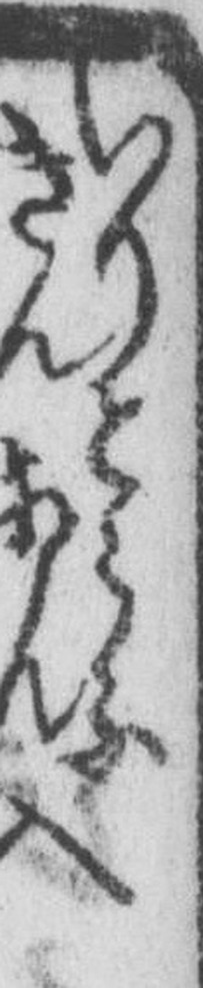いりとうふ
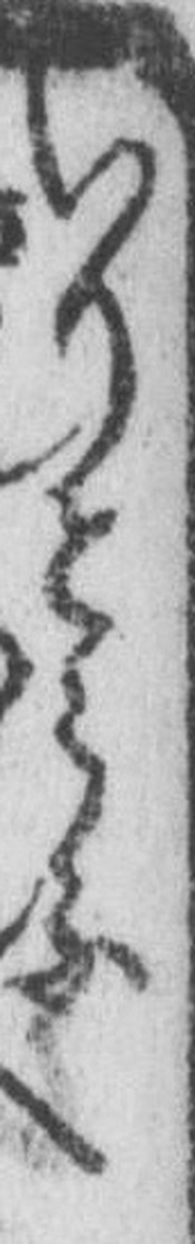いりとうふ
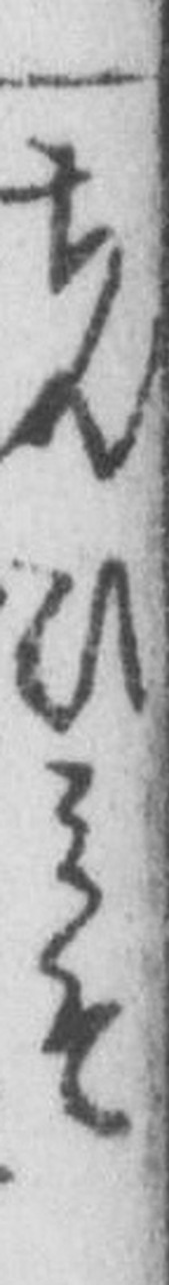ちんひミそ
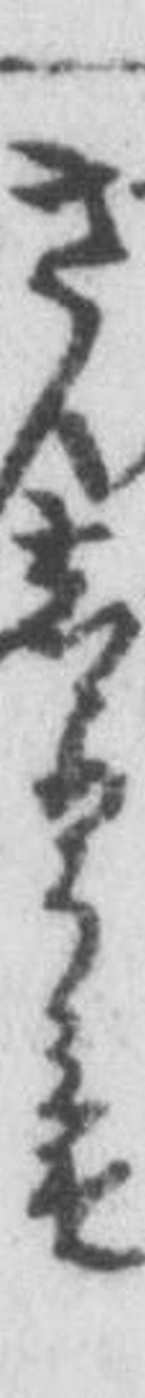さんしようミそ
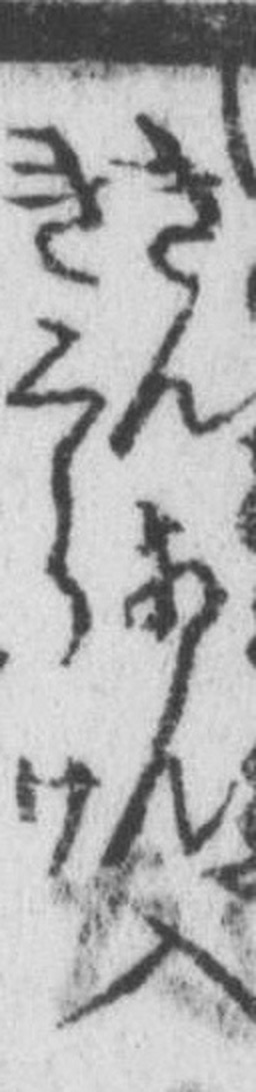きくらけ
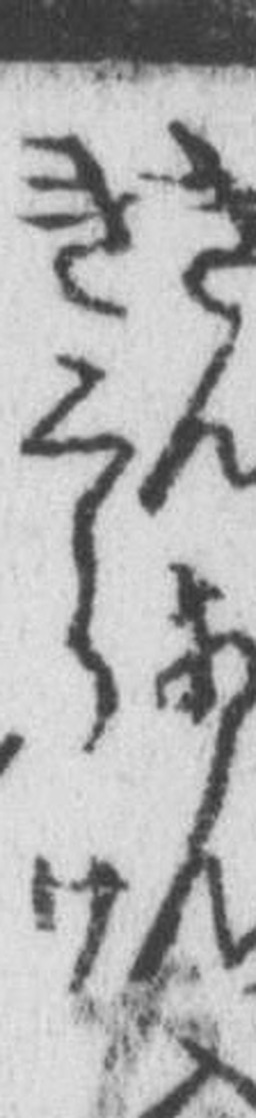きくらけ
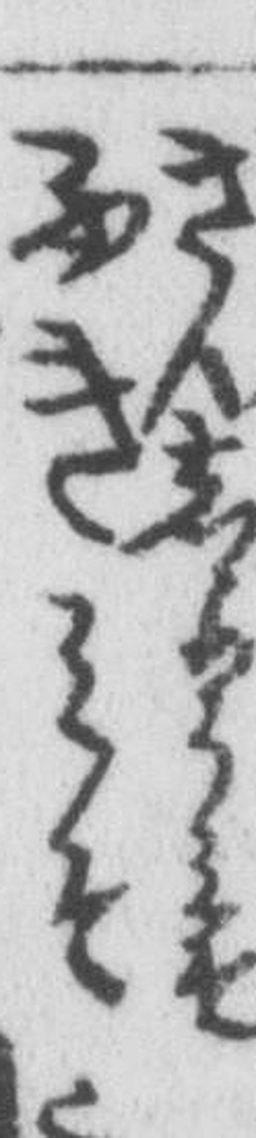ふきミそ
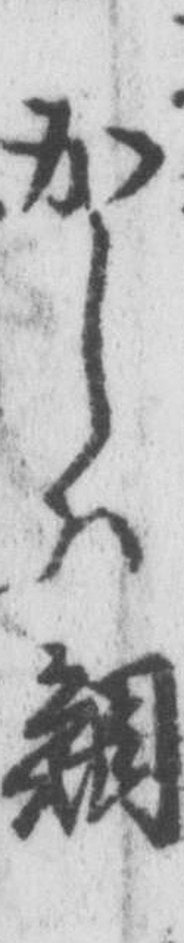かしハ鯛
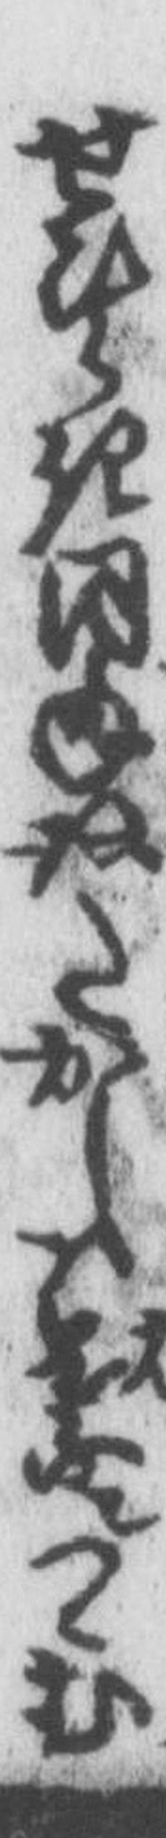せひらきほねぬきたかして葉をつゝむ
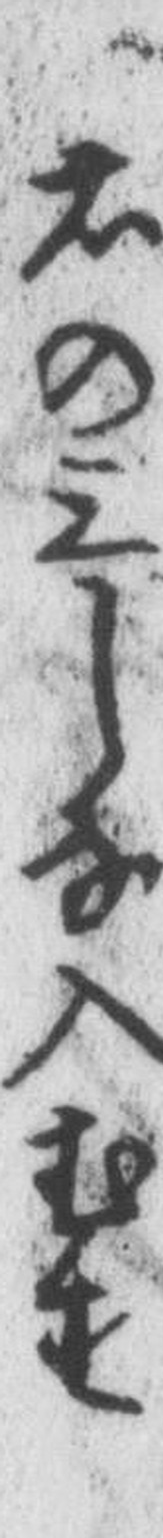右の三しな入むす
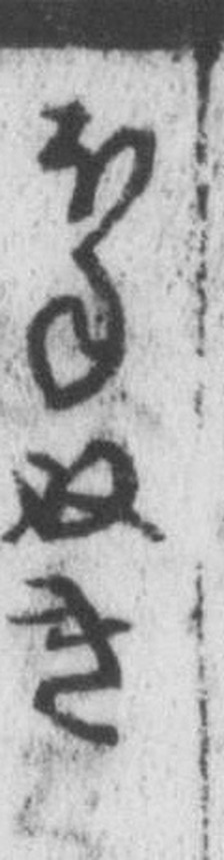ほねぬき
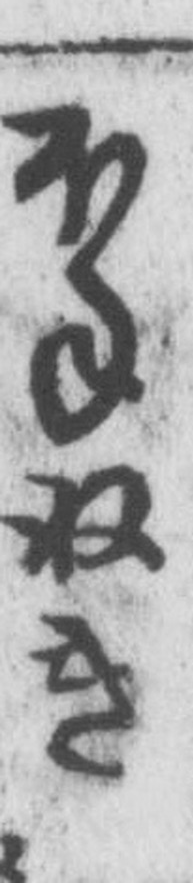ほねぬき
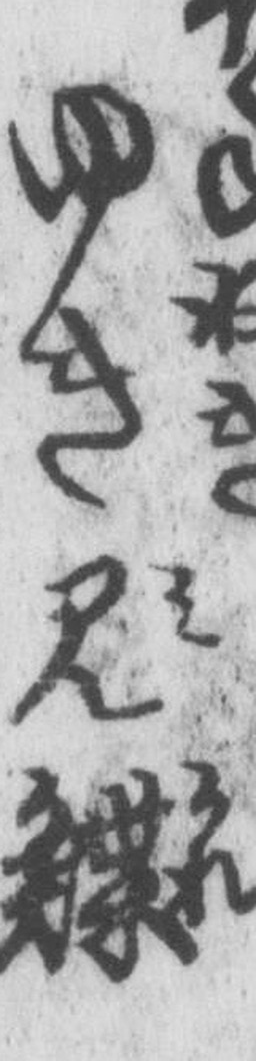やき見鰈
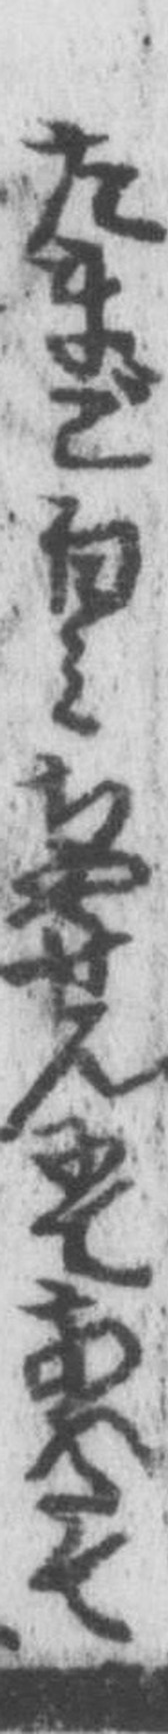たまご白ミちやせんにてあハたて
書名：当世料理献立
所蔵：大阪府立大学学術情報センター 国文学研究資料館
